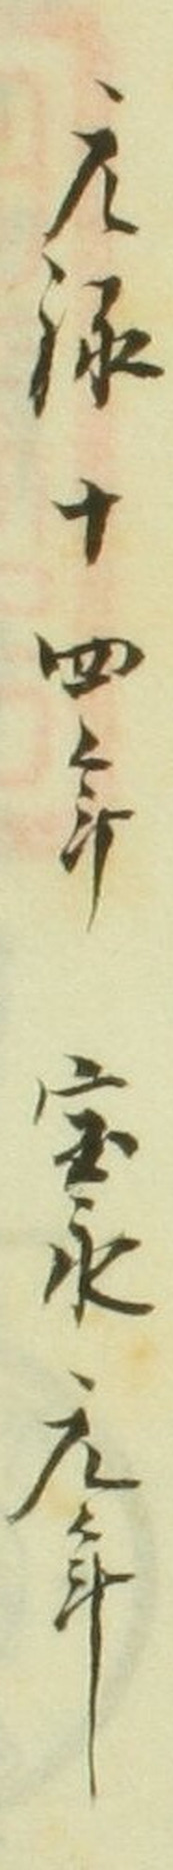元禄十四年宝永元年
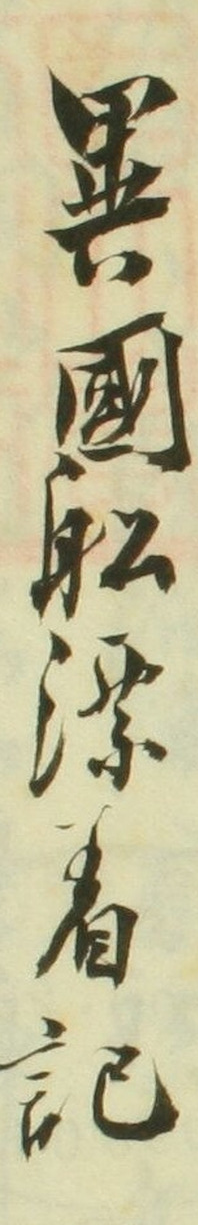異国船漂着記

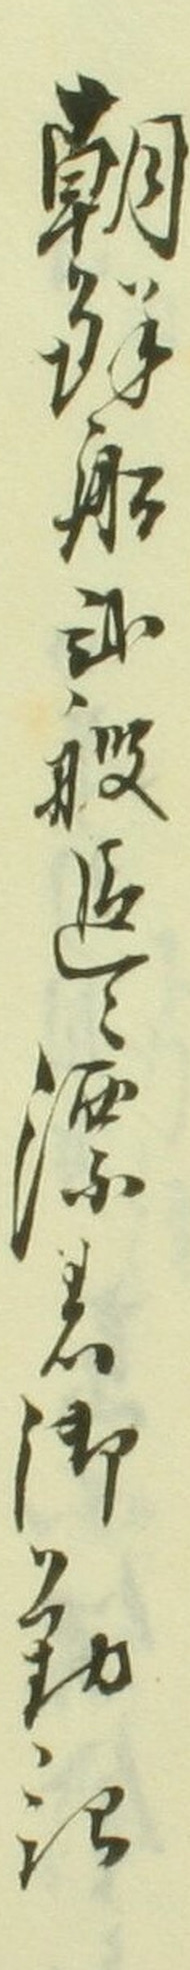朝鮮船弐艘追々漂着御勤記
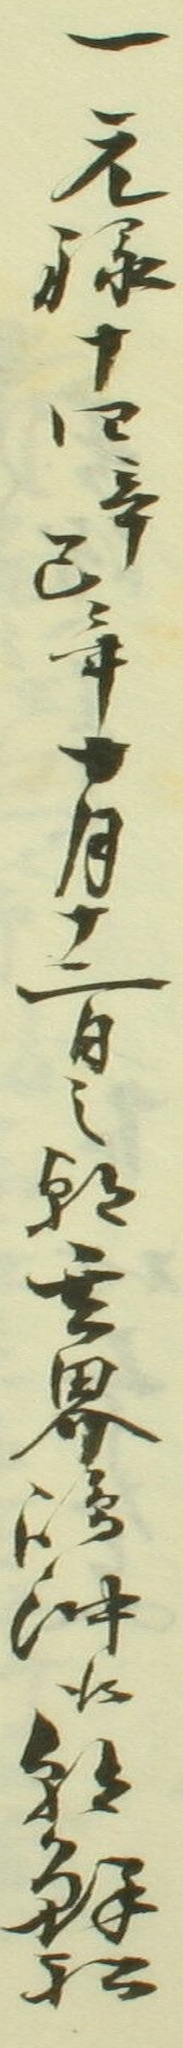一元禄十四年辛己年十月十二日之朝玄海嶋沖江朝鮮船
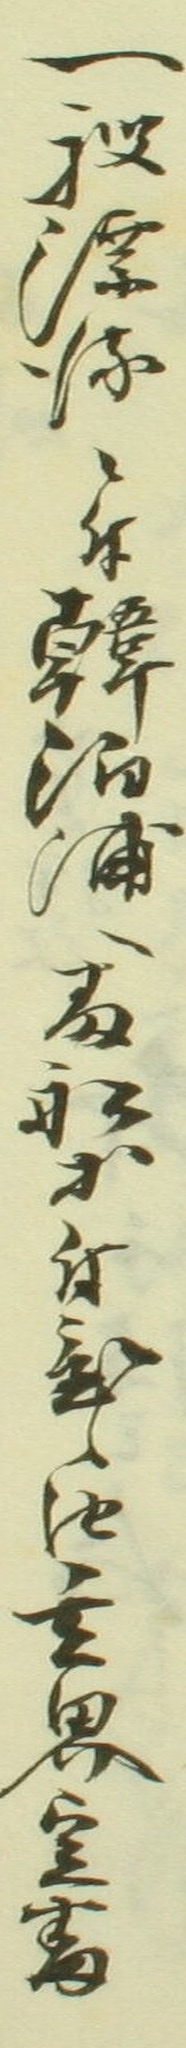一艘漂流ニ付韓泊浦へ番船等付置候由玄海定番
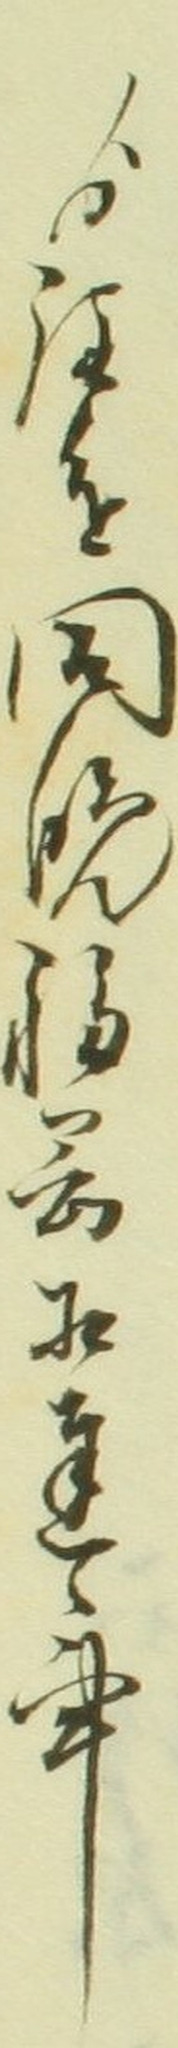ゟ注進同晩福岡相達候事
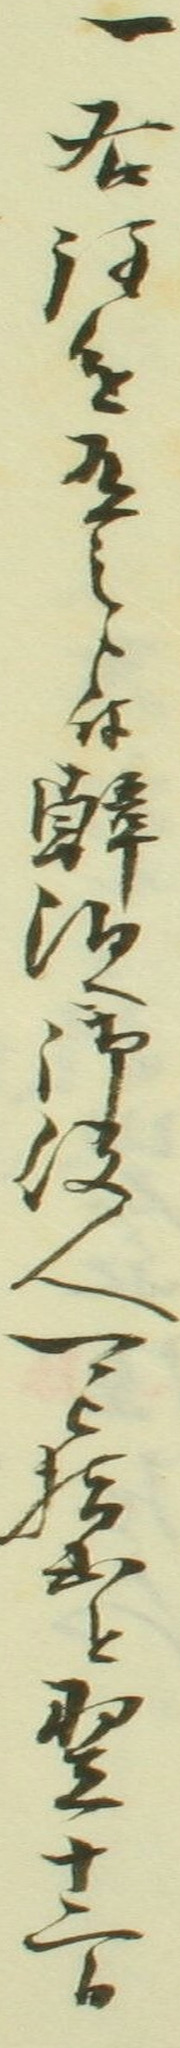一右注進有之候付韓泊へ御役人可被指出と翌十二日
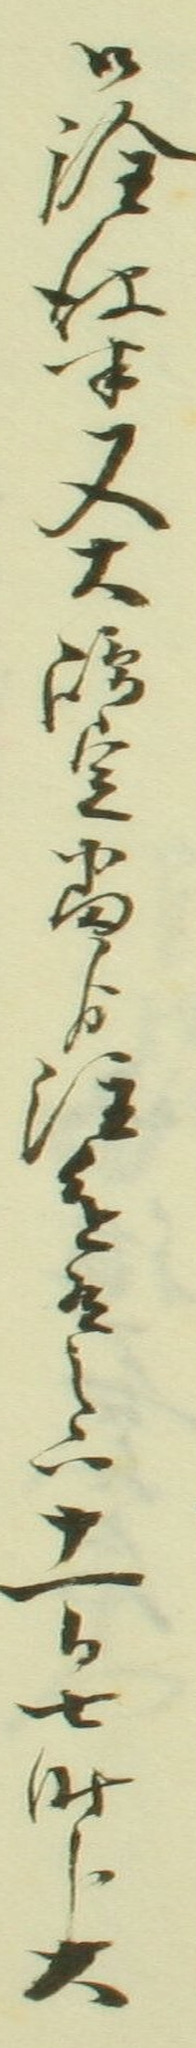御詮議半又大嶋定番ゟ注進有之候ハ十一日七時分大
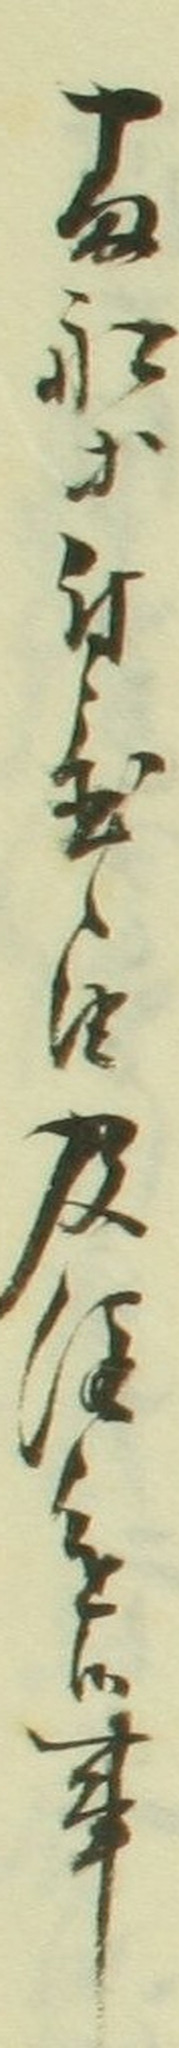番船等付置候由及注進候事
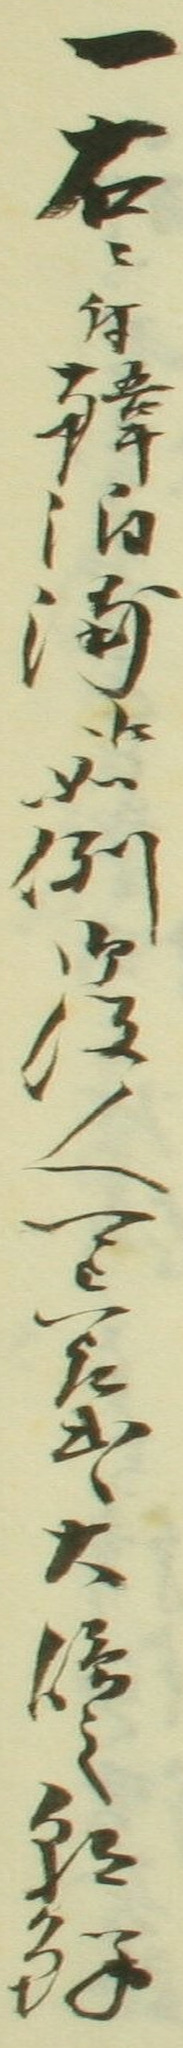一右ニ付韓泊浦江如例御役人可被差出候大嶋之朝鮮

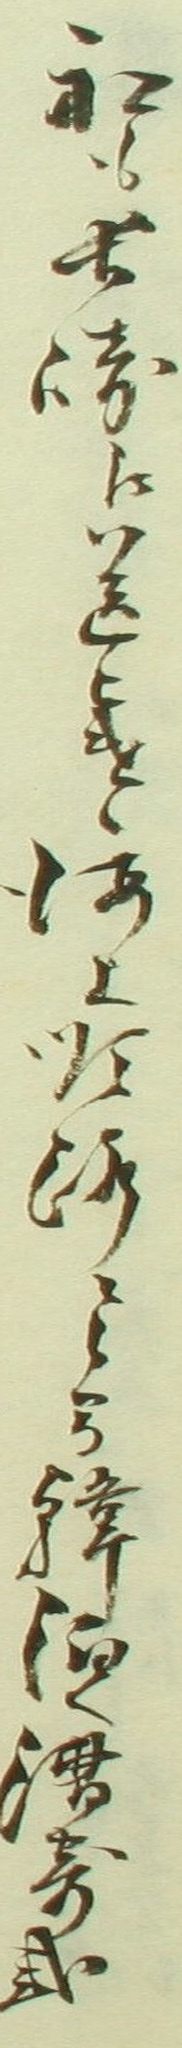船も長崎江送被遣候海上順路ニ被候間韓泊へ漕寄弐
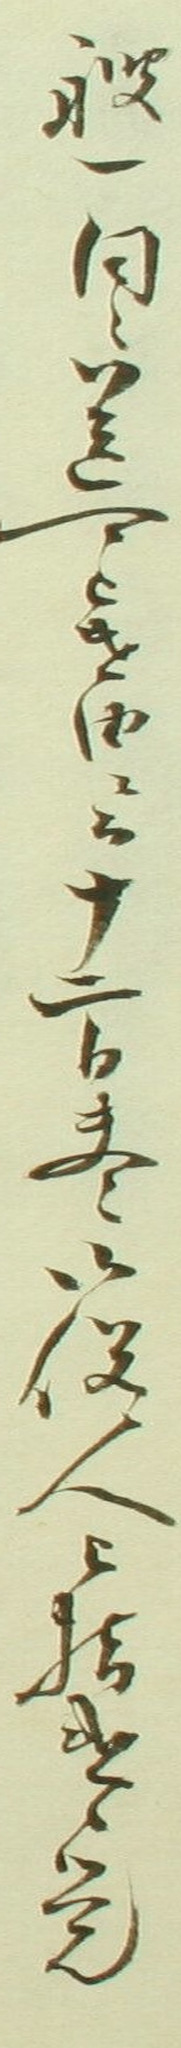艘一同ニ送可被遣由ニ而十二日夫々御役人被指遣候覚
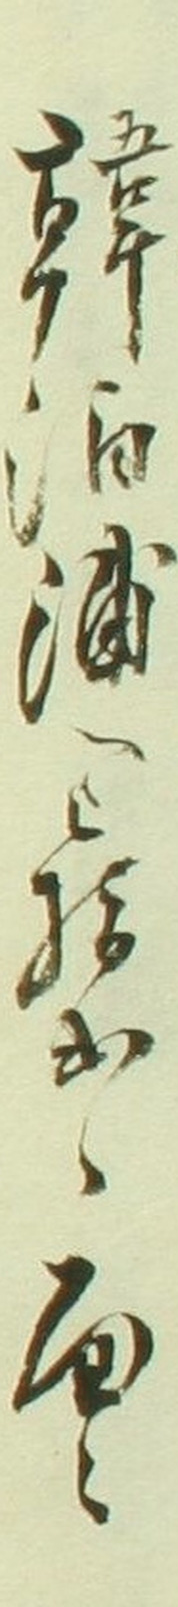韓泊浦へ被指出候面々
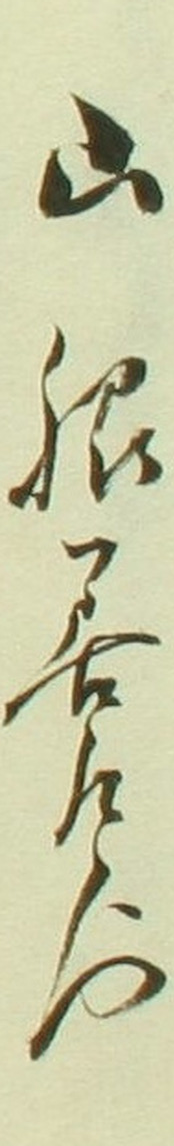山脇善左衛門
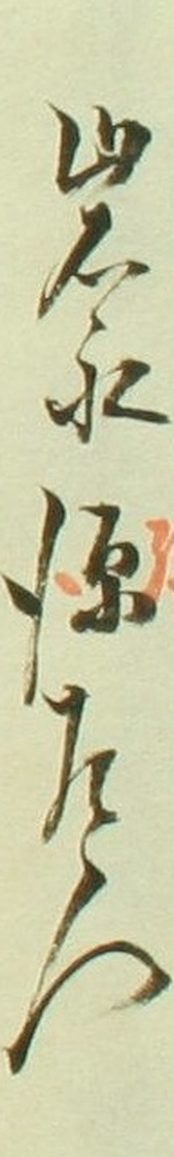岩永源左衛門
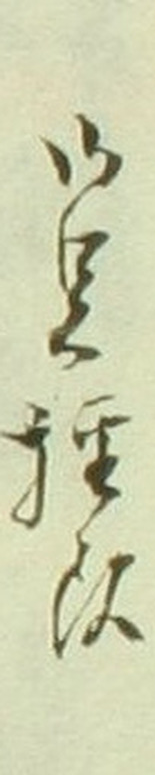御足軽頭
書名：異国船漂着記
